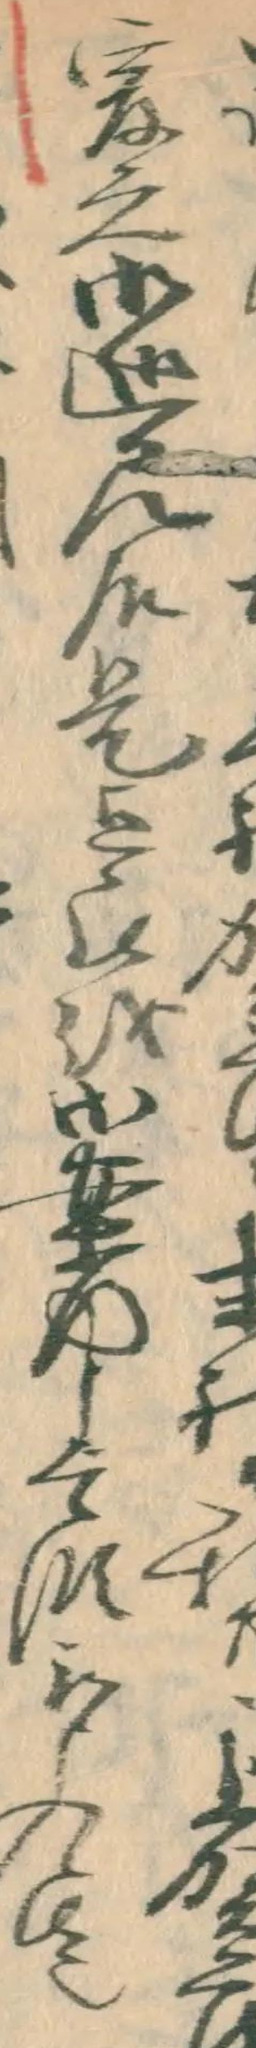爰元御巡見故是迄罷越御案内申上候段被申入候由也
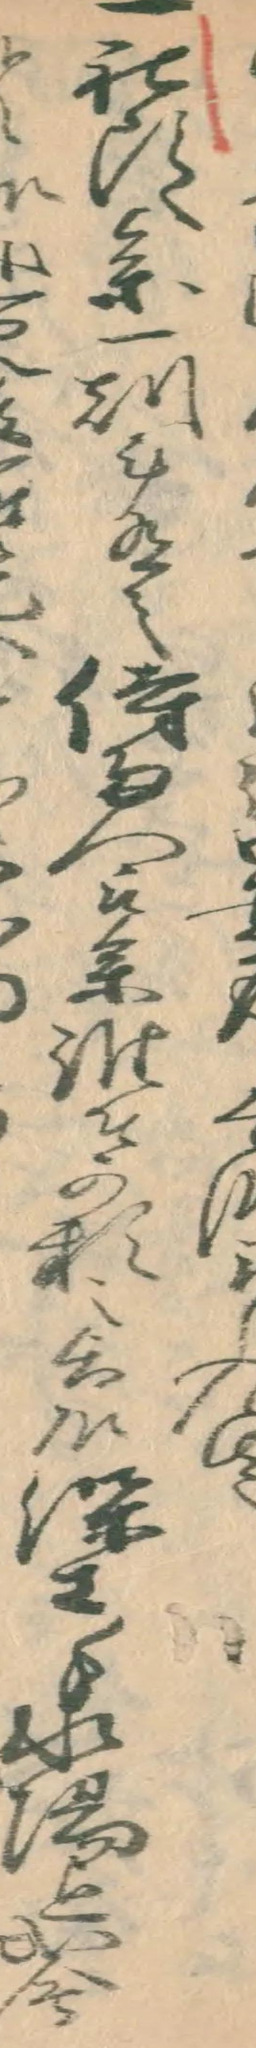一社頭へ参一刻計有之侍両人被参誰そ可頼之旨故保土手水場迄出会
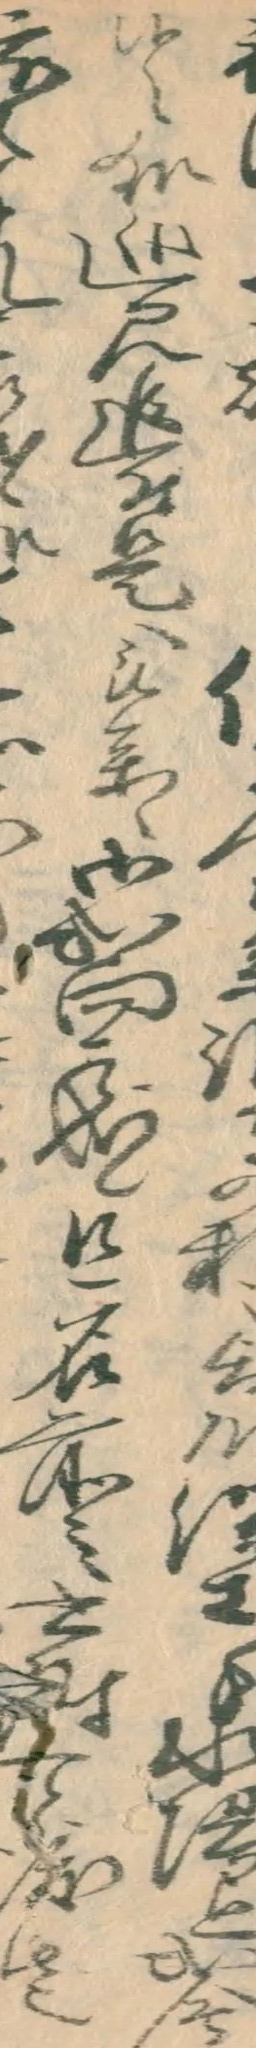候之処巡見追付是へ被参候御出向可被成候且名前之書付可被渡由也
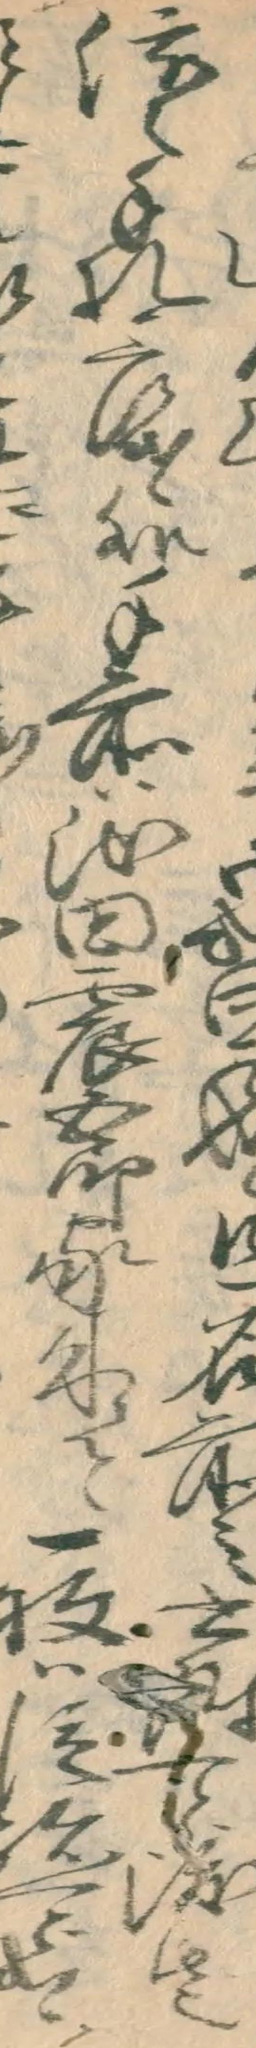依之手札差出候処手前ハ池田震五郎家来ニ候て一枚ハ従跡可被出候
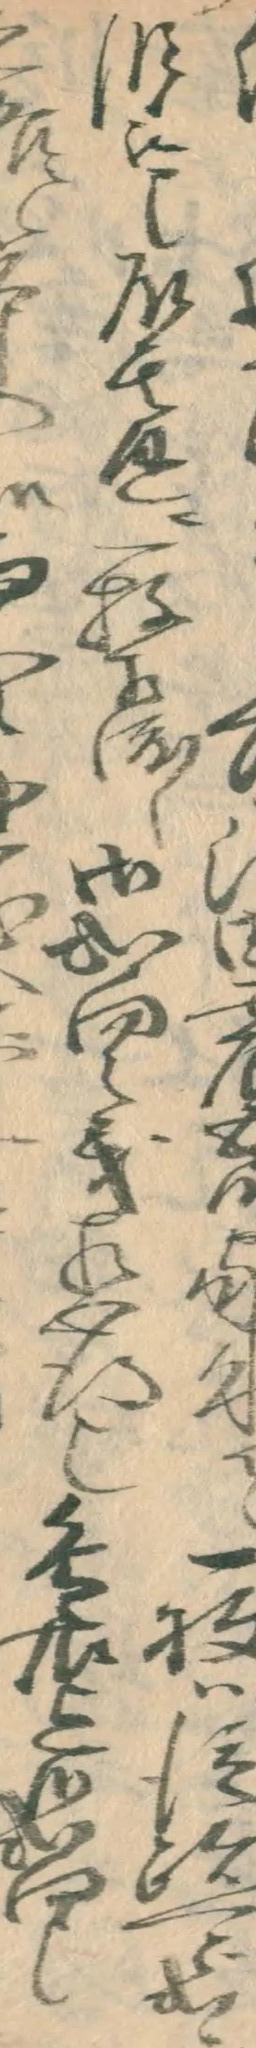段被申候故其通ニ一枚相渡候御出向之義相心得申候鳥居迄御出向申候
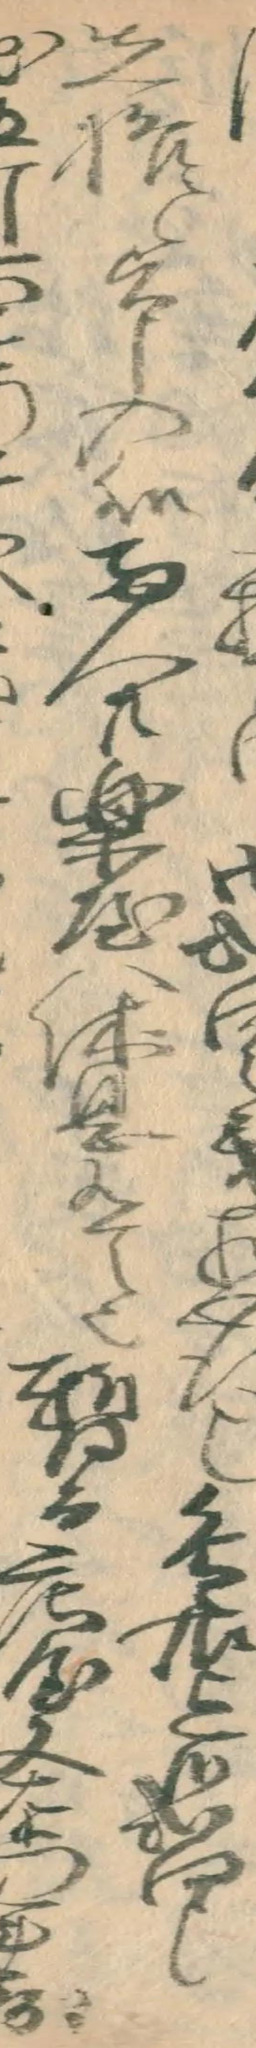先格ニ候旨申入候処両人共楽屋へ休息有之也暫而庄屋又左衛門年寄
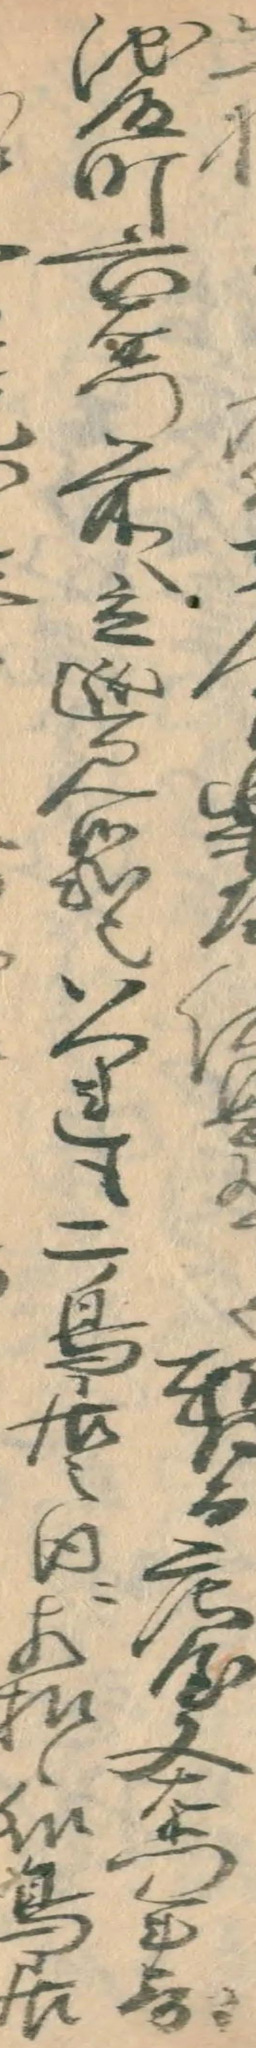池尻町六右衛門前へ立巡見御出也いつれも二ノ鳥居之内ニ相扣候処鳥居
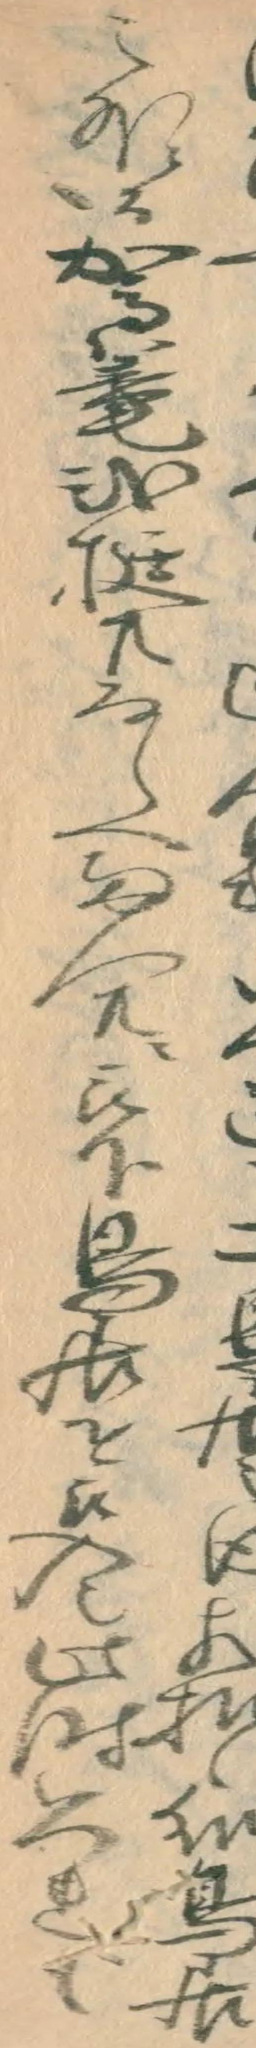之外ニ而駕篭弐挺共ならへ両人共ニ被下鳥居を被入也此時いつれへも

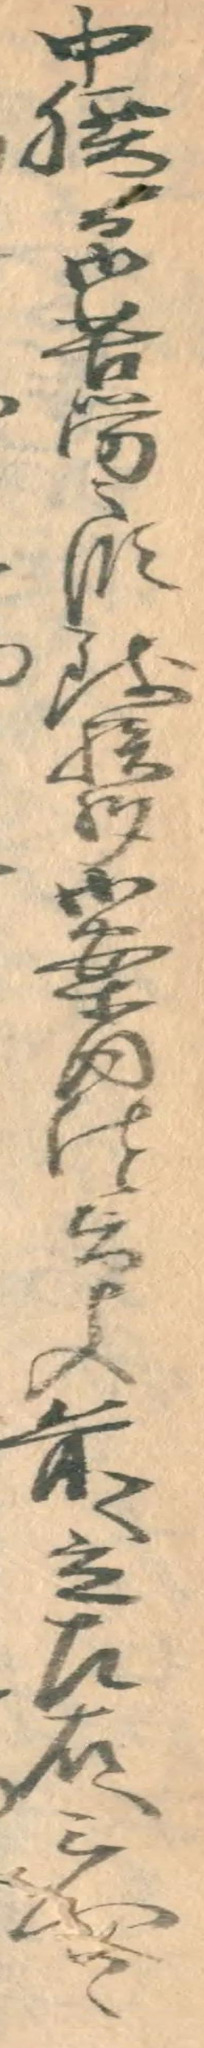中腰ニ而御苦労之段致挨拶御案内仕候旨申入前へ立左右へ三人ツヽ
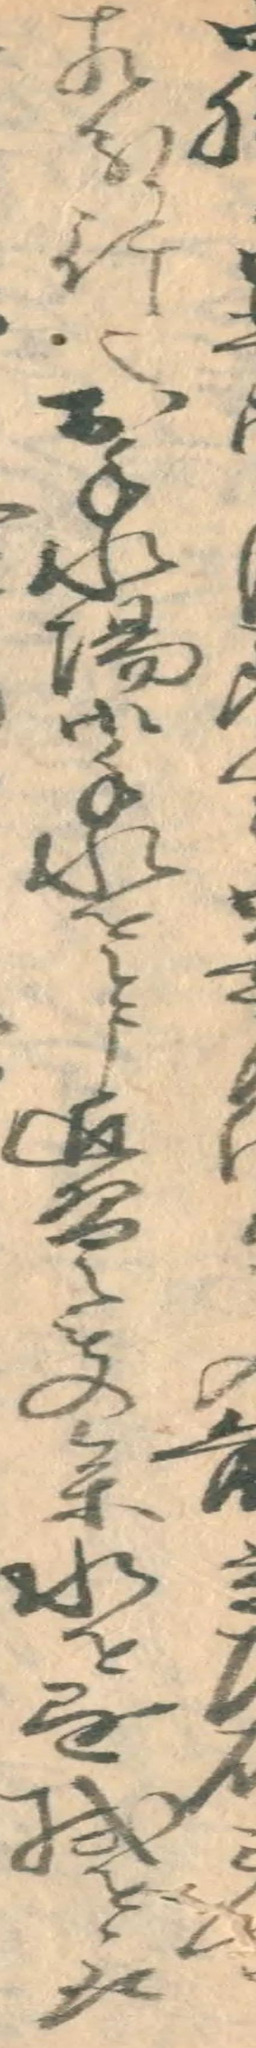相分り行也於手水場御手水をと申近習之もの参水を懸拭を取
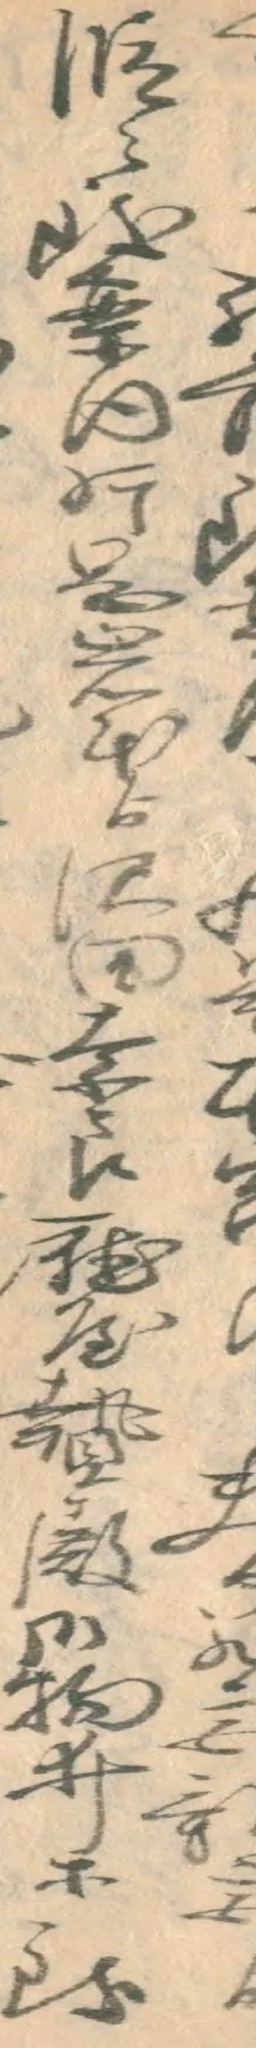段々致案内片岡岩本ゟ沢田奈良庁屋贄殿御物井等致
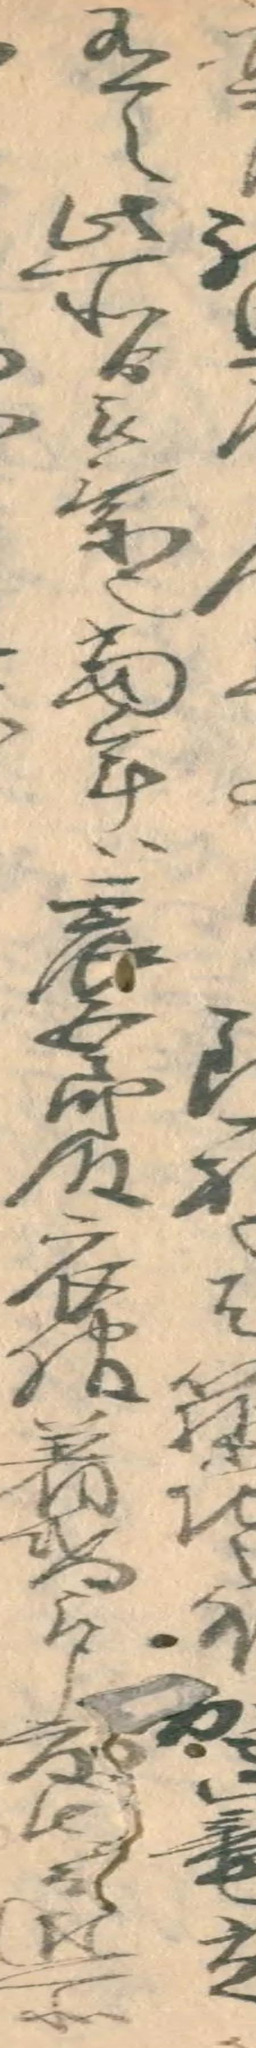有之此所ゟ被乗也当年ハ震五郎殿衣服着替被申度由ニ而近所
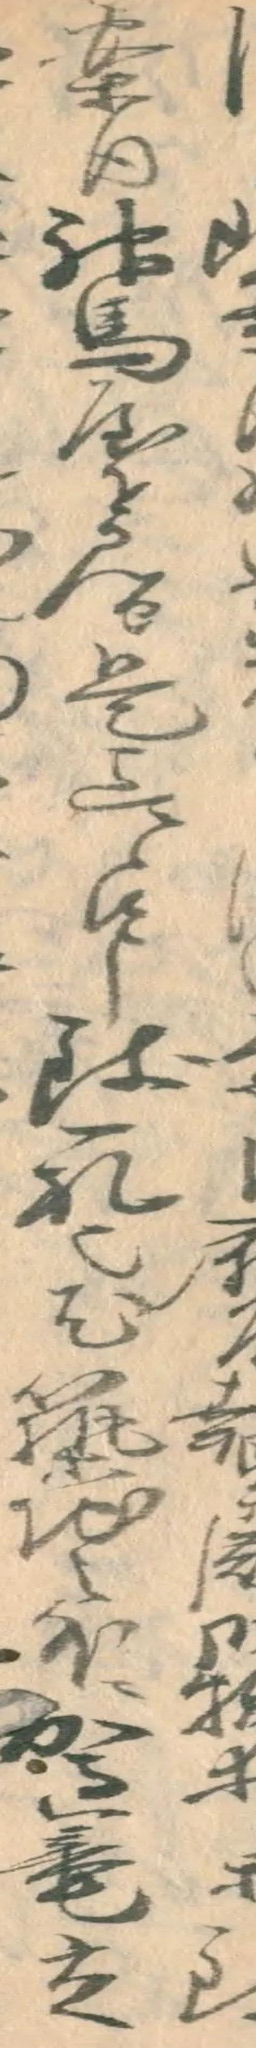案内神馬屋を見セ是迄ニ候由申致一礼也尤築地之外ニ駕篭立
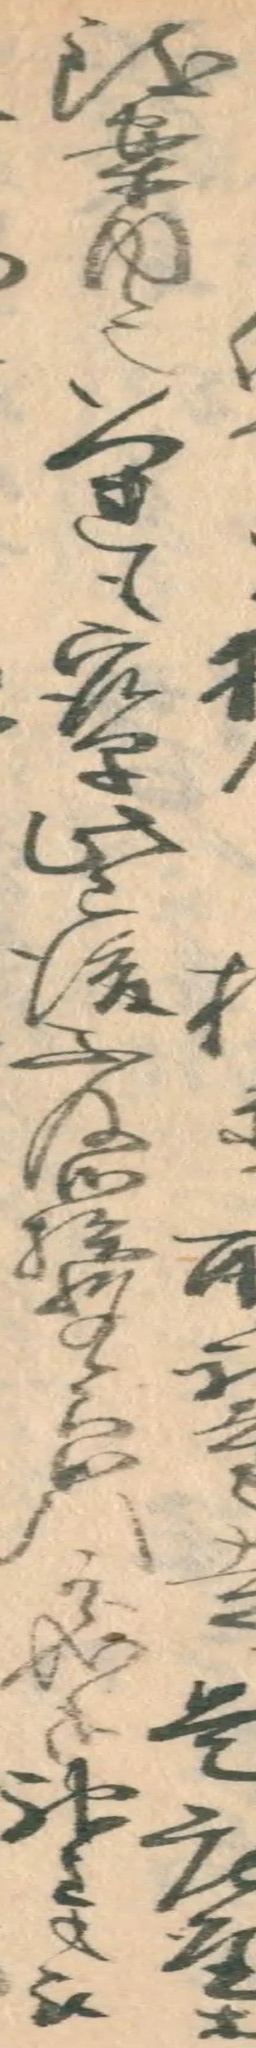致案内候也いつれも最早此已後不及御挨拶候間御引可被成哉神主も被
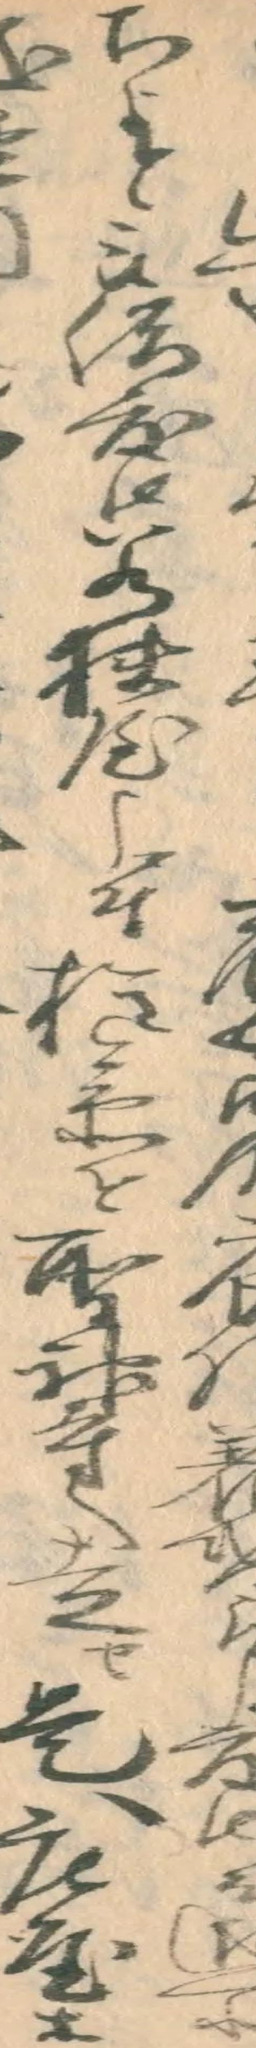ちよと被借度由若狭屋申ニ付権兵衛を聖神寺へ走セ是へ庄屋等
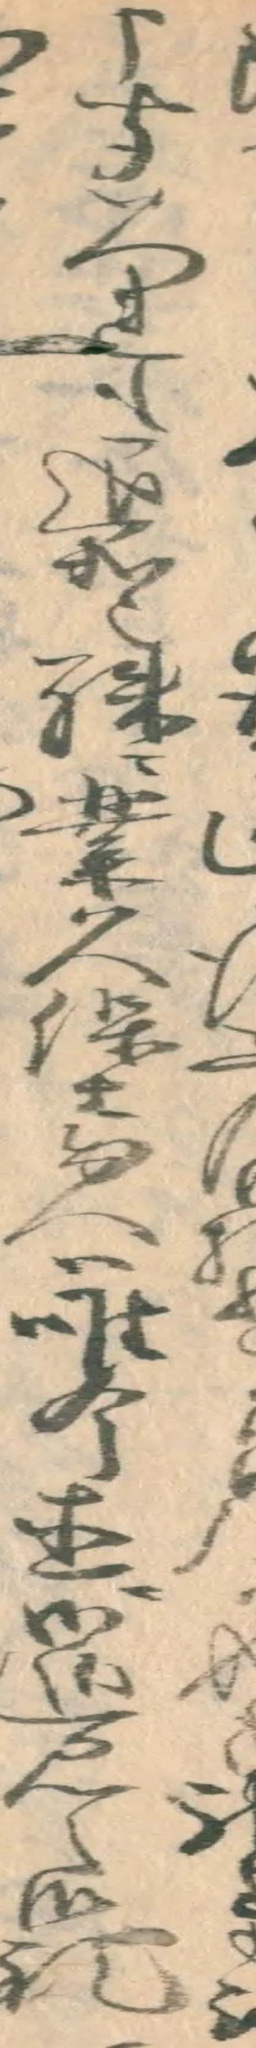申聞御いつれも退出也殊ニ業久保土両人ハ唯今直ニ御巡見之御礼ニ
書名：賀茂社記録. 第58冊
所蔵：国立国会図書館 National Diet Library, JAPAN
